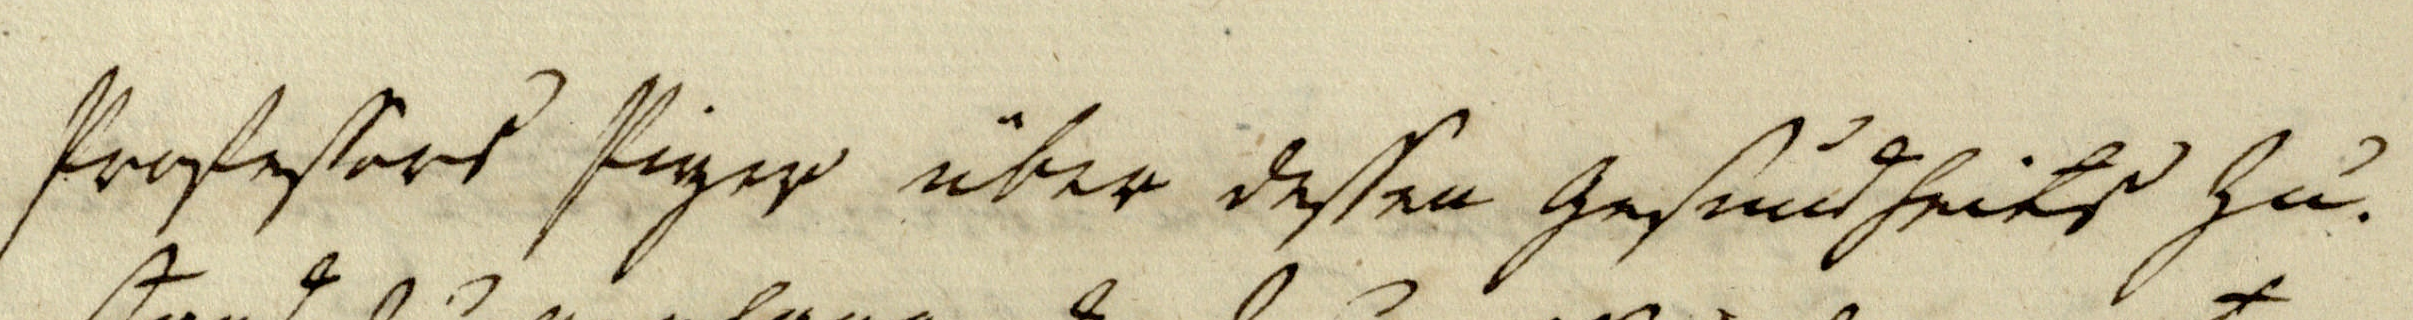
Professors Piper über dessen Gesundheits zu¬
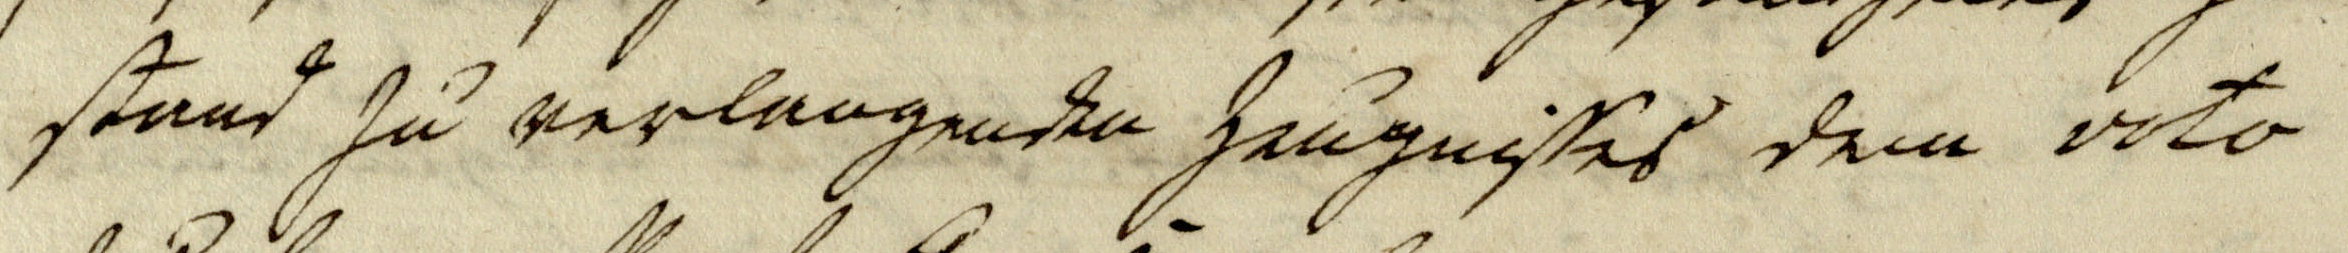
stand zu verlangenden Zeugnisses dem voto
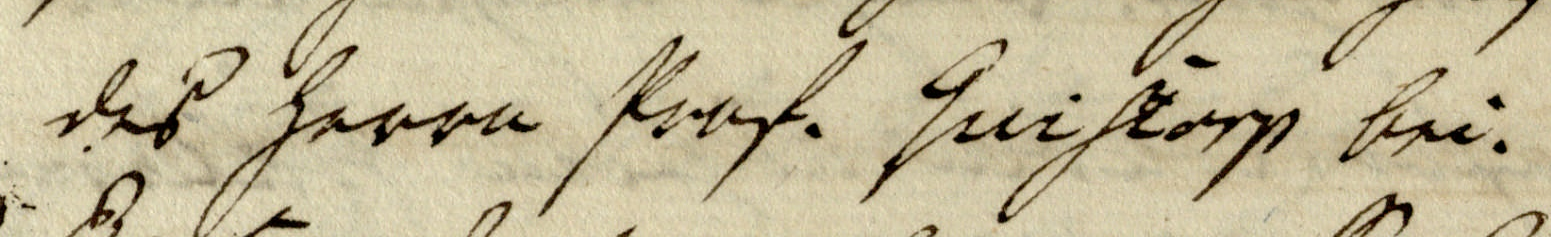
des Herrn Prof. Quistorp bei.
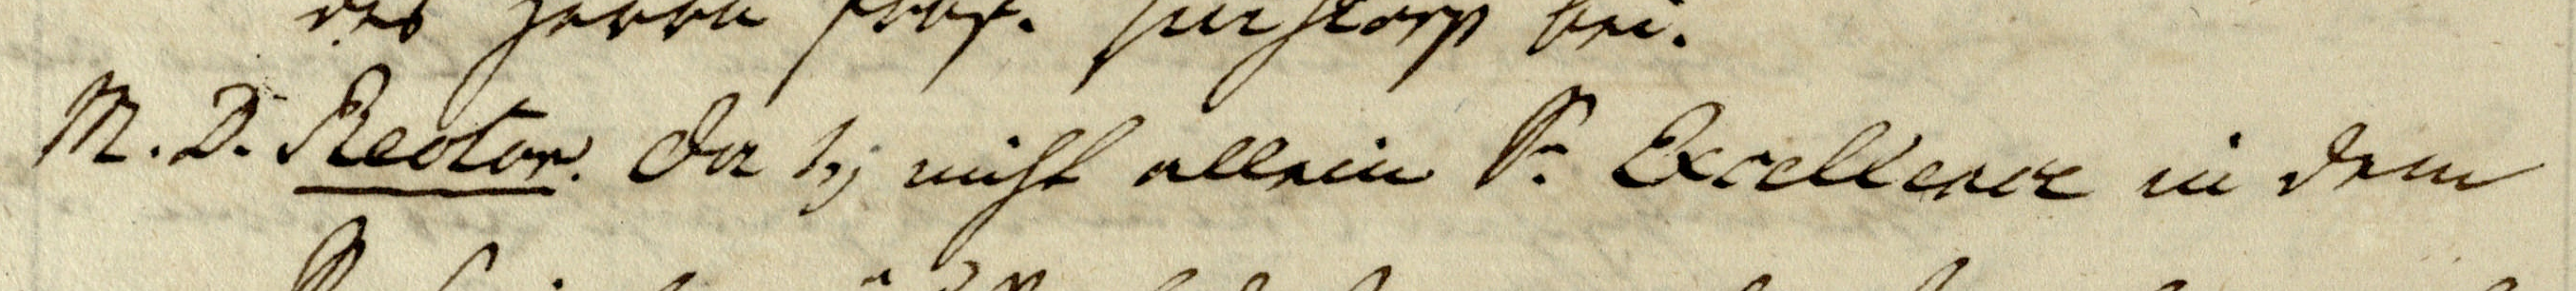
M. D. Rector Da 1., nicht allein Sr Excellence in dem
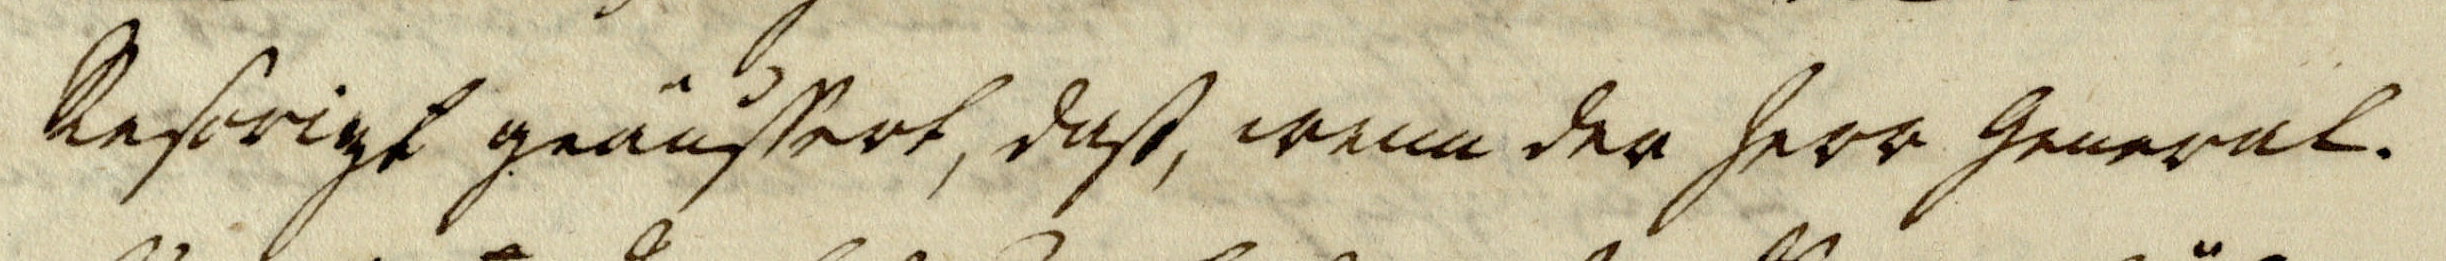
Rescript geäussert, daß, wenn der Herr General¬
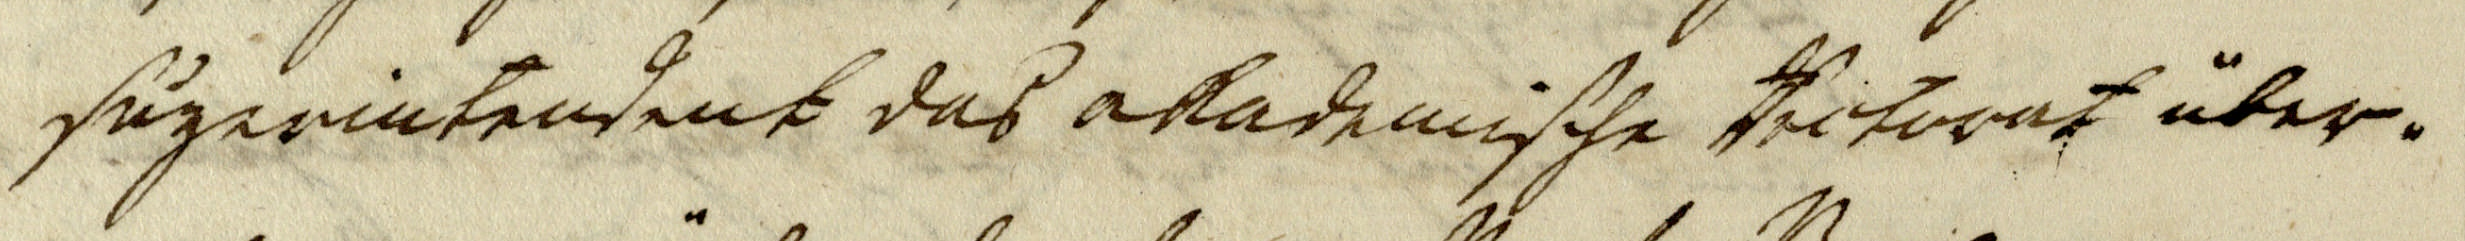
superintendent das akademische Rectorat über¬
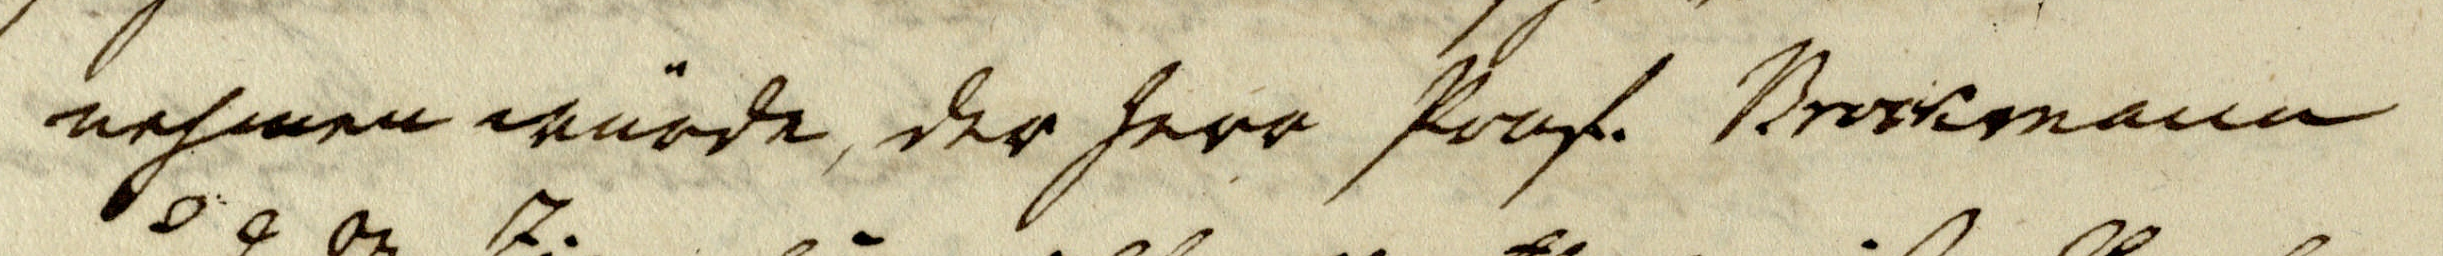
nehmen würde, der Herr Prof. Brockmann
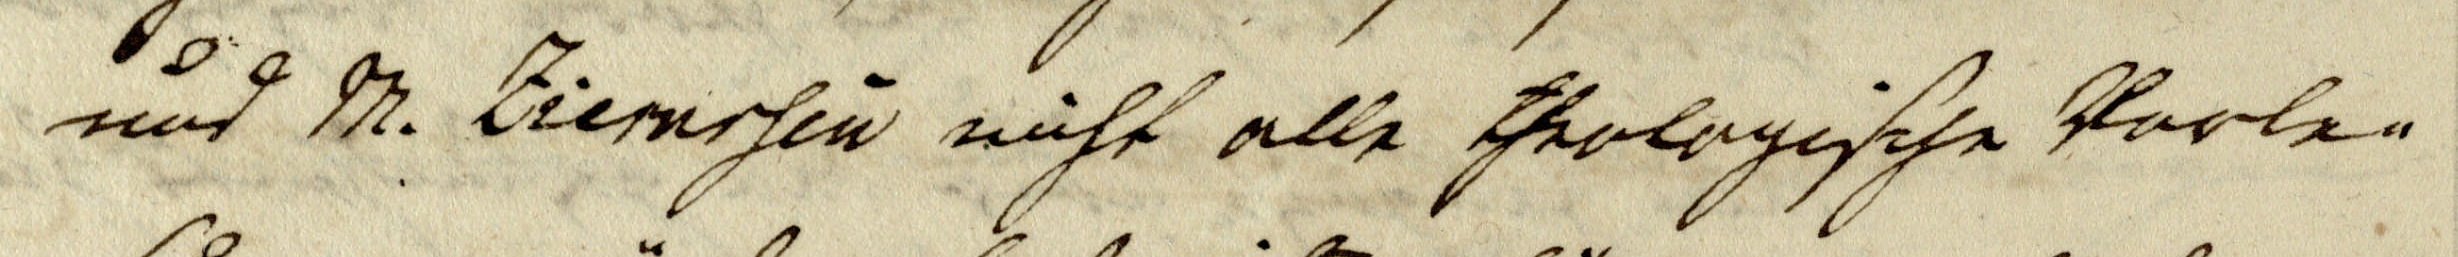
und M. Ziemssn nicht alle theologische Vorle¬
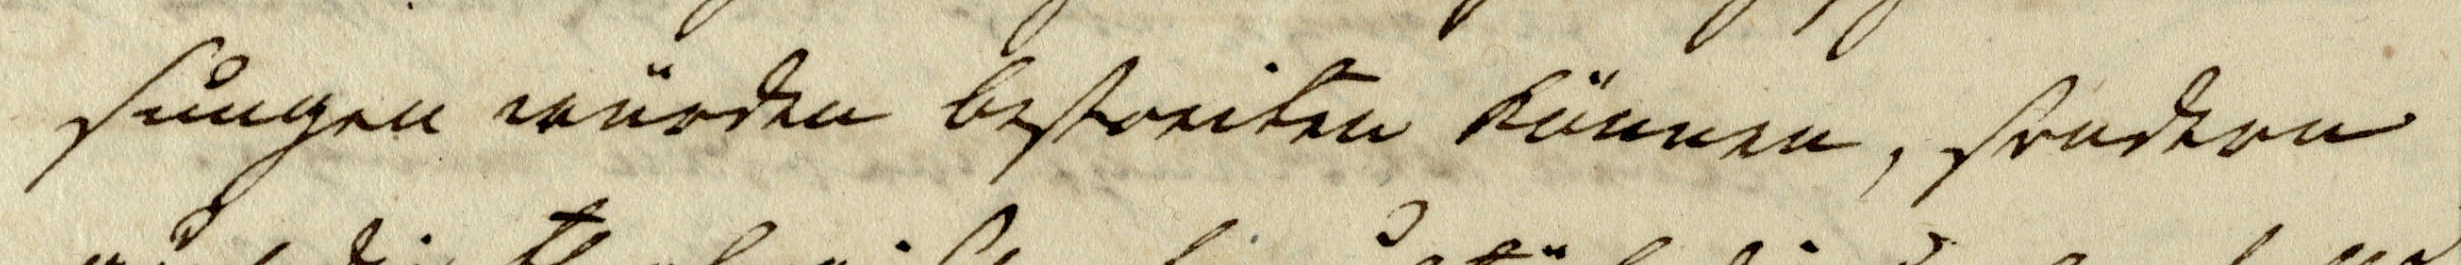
sungen würden bestreiten können, sondern
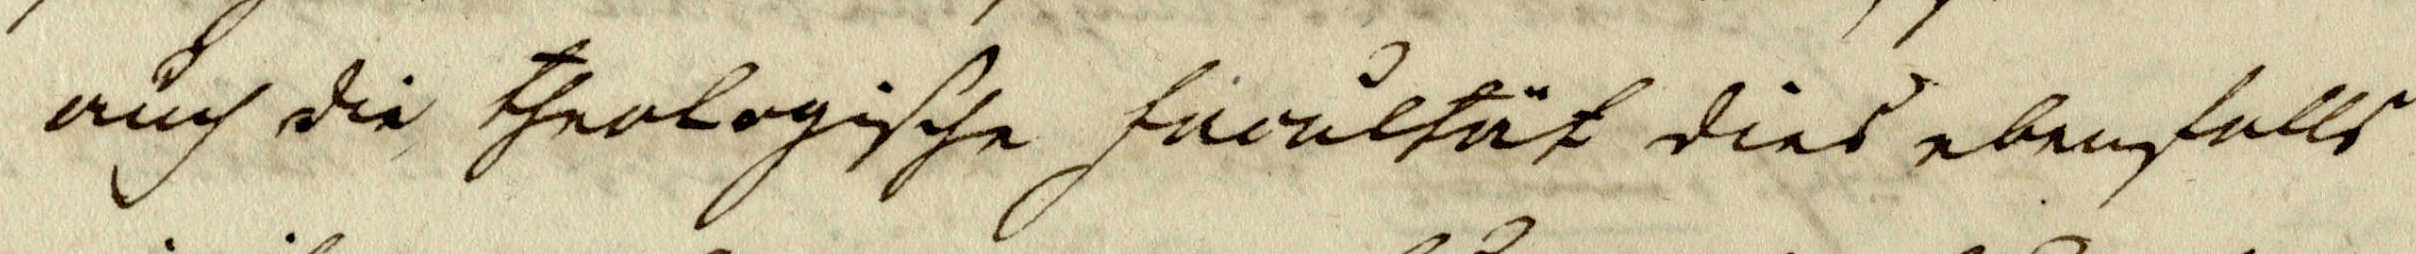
auch die Theologische Facultät dies ebenfalls
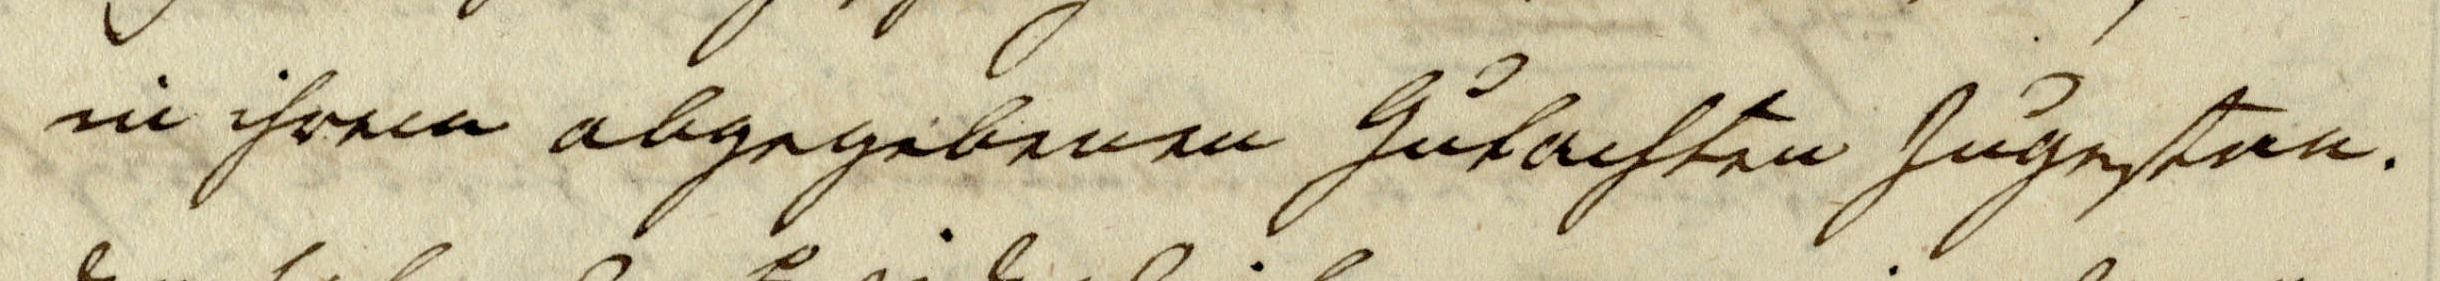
in ihrem abgegebenen Gutachten zugestan¬
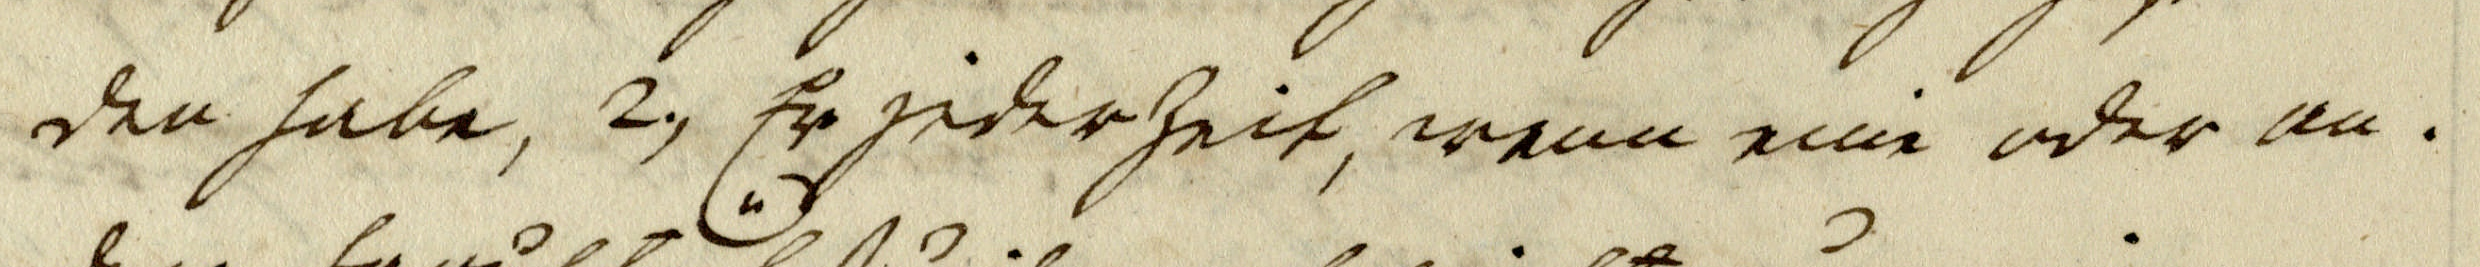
den habe, 2.,Er jeder Zeit, wenn eine oder an¬
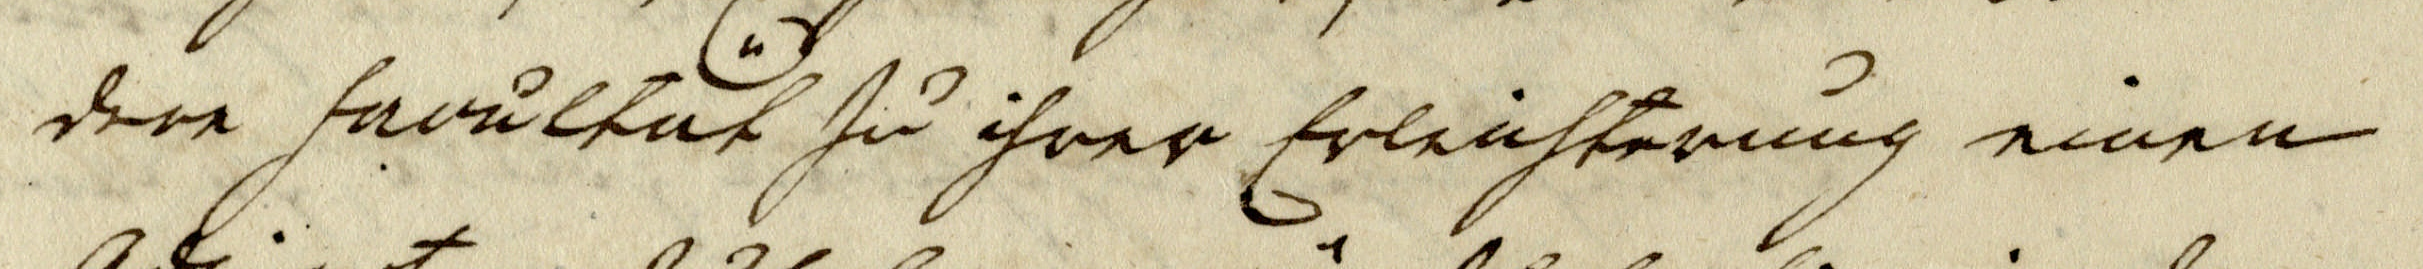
dere Facultät zu ihrer Erleichterung einen
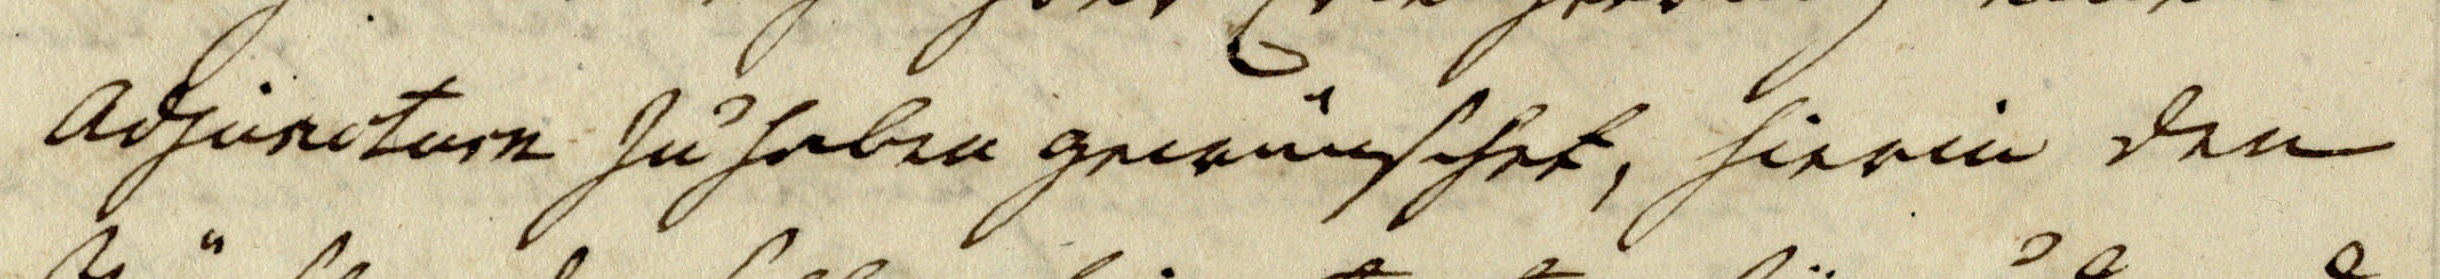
Adjunctum zu haben gewünschet, hierin den
